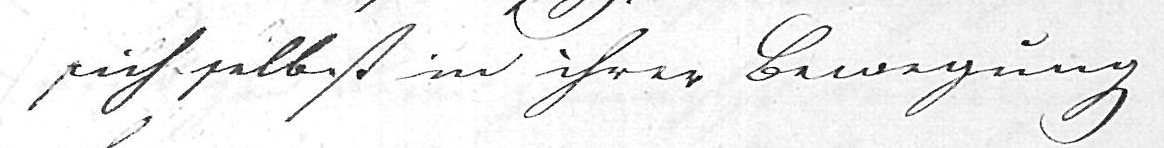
sich selbst in ihrer Bewegung
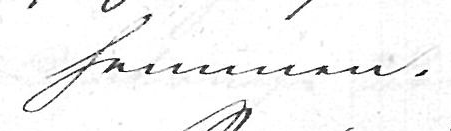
hemmen.
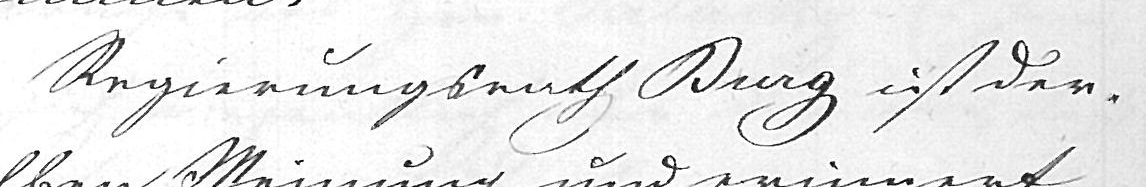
Regierungsrath Burg ist der-
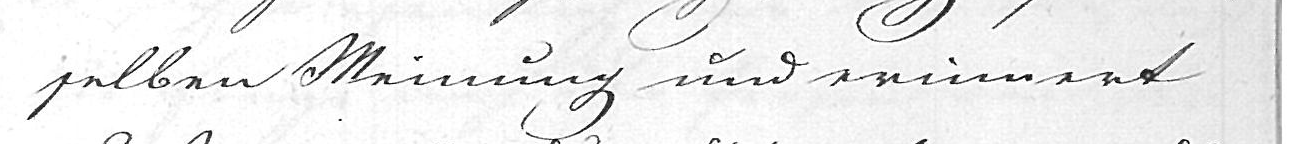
selben Meinung und erinnert
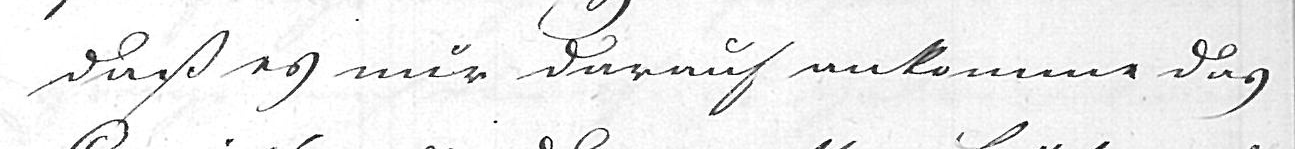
daß es nur darauf ankomme das
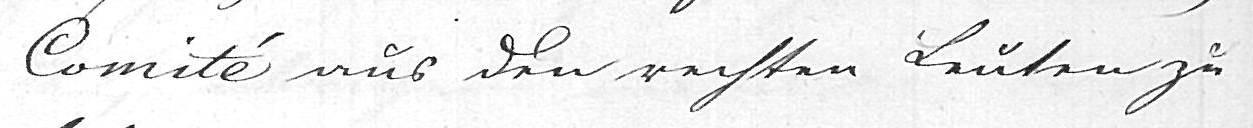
Comité aus den rechten Leuten zu
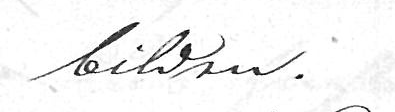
bilden.
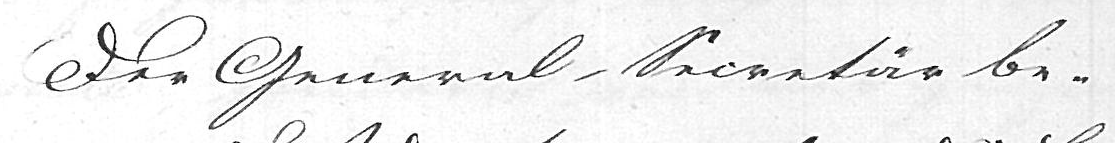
Der General-Secretär be-
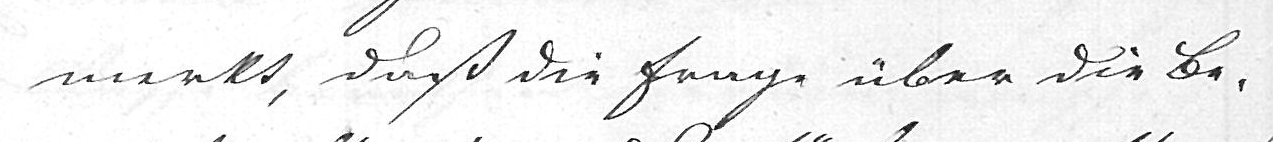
merkt, daß die Frage über die Be-
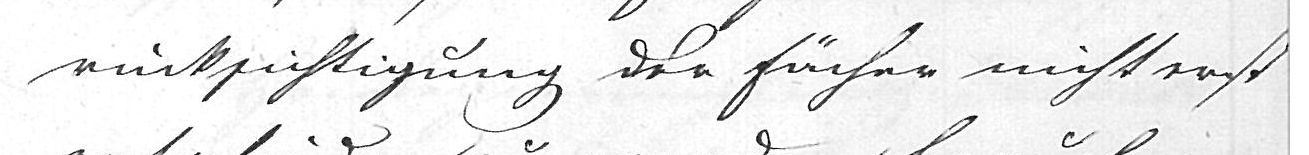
rücksichtigung der Fächer nicht erst
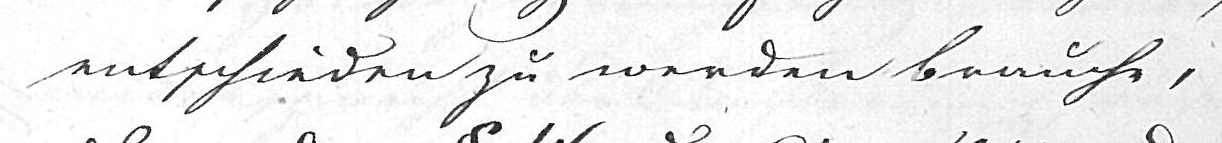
entschieden zu werden brauche,
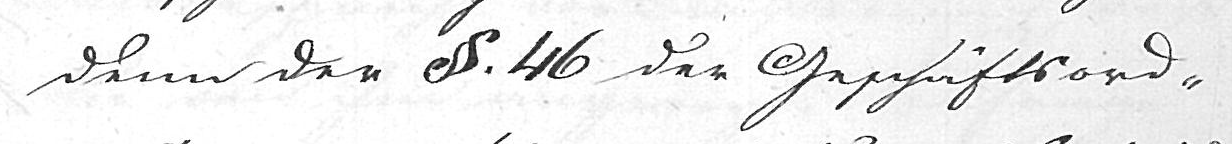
denn der § 46 der Geschäftsord-
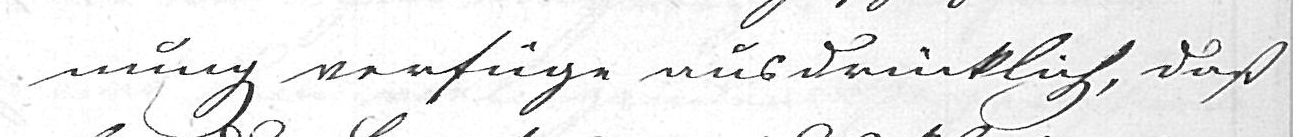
nung verfüge ausdrücklich, daß
